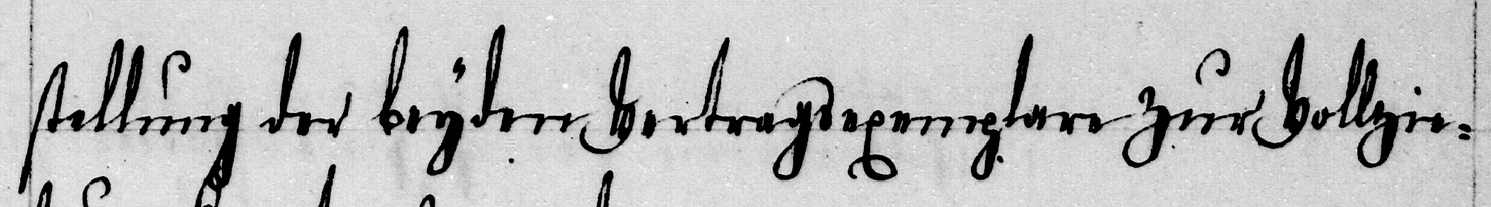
stellung der beyden Vertragsexemplare zur Vollzie¬
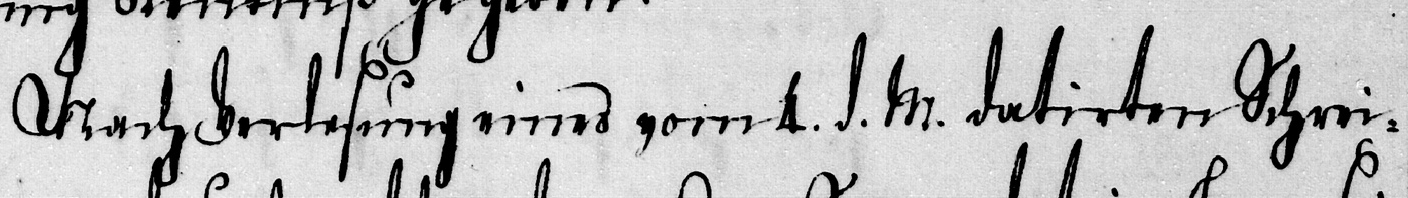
Nach Verlesung eines vom 4. d. M. datirten Schrei¬
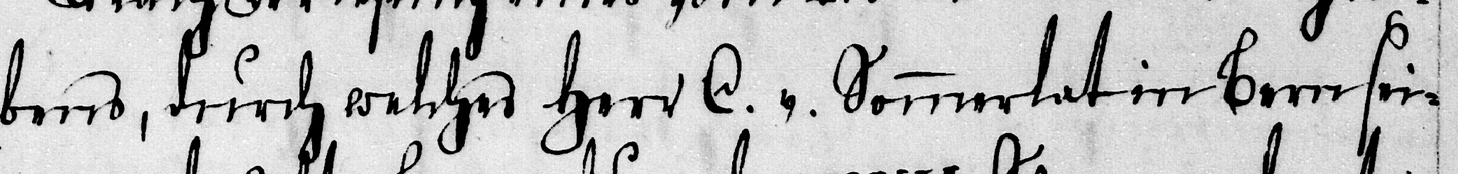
bens, durch welches Herr C. v. Sommerlat in Bern sei¬
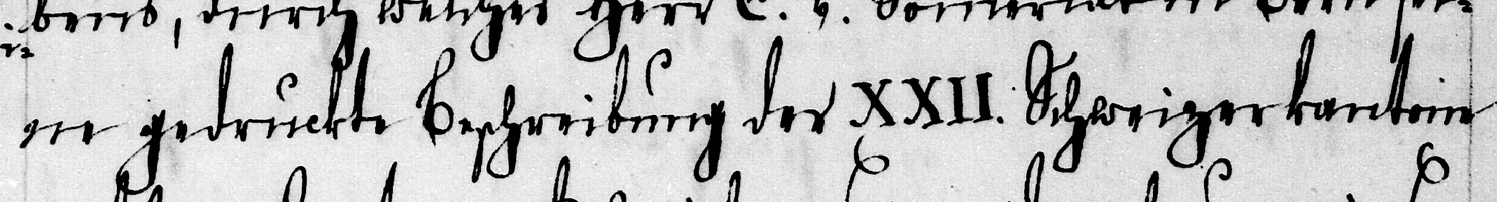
ne gedruckte Beschreibung der XXII. Schweizerkantone
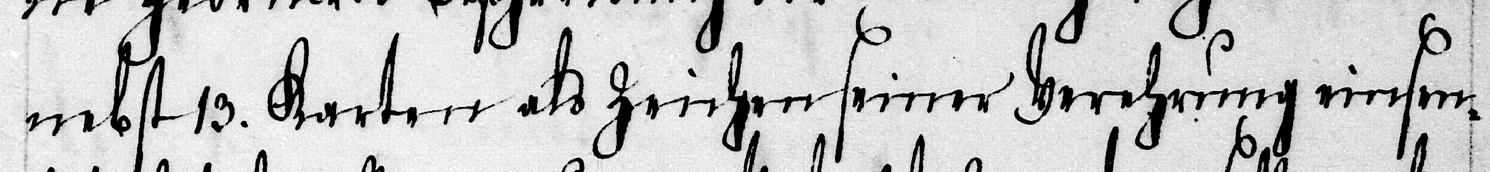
nebst 13. Karten als Zeichen seiner Verehrung einsen¬
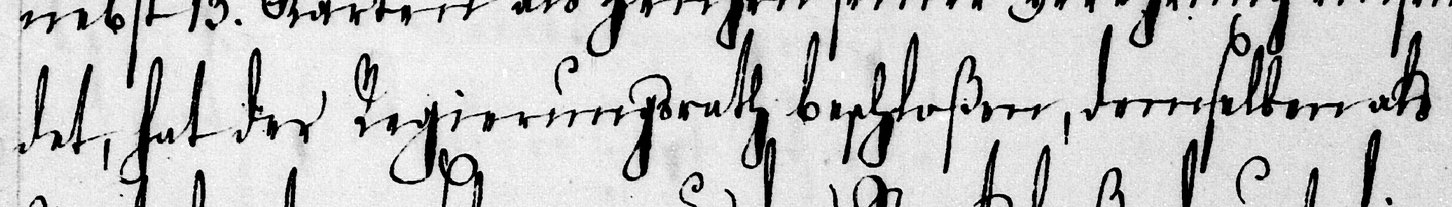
det, hat der Regierungsrath beschloßen, demselben als
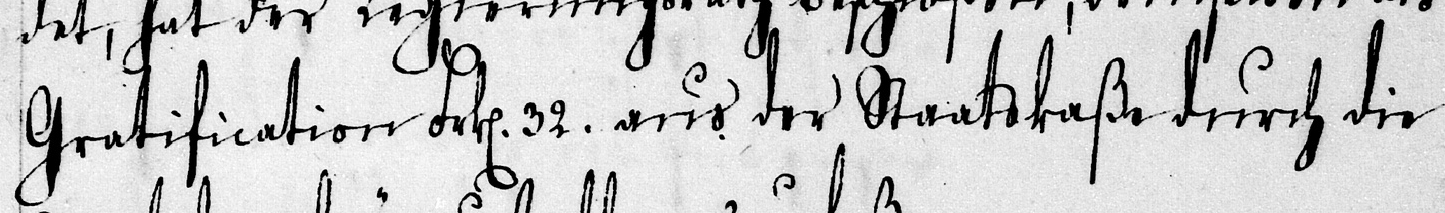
Gratification Frk[en]. 32. aus der Staatskaße durch die
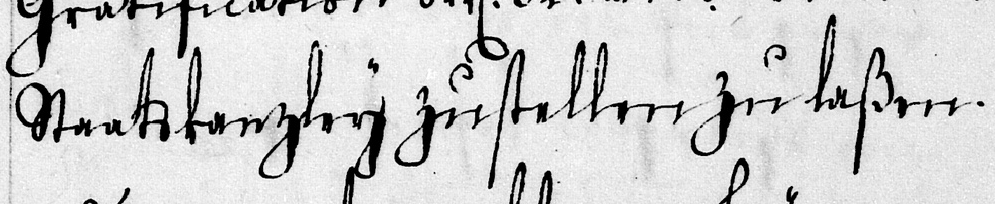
Staatskanzley zustellen zu laßen.
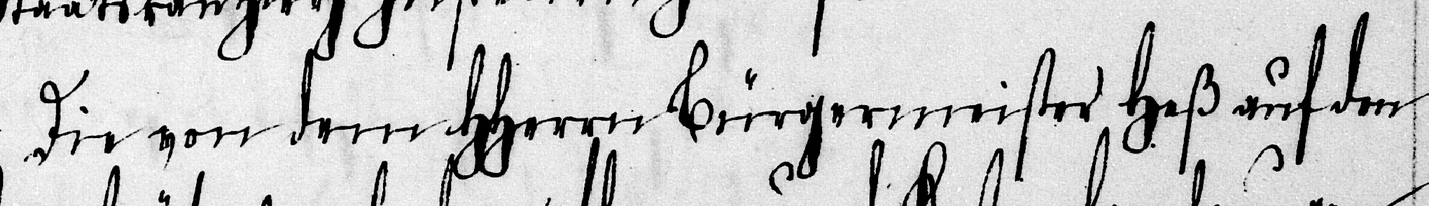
Die von dem HHerrn Bürgermeister Heß auf den
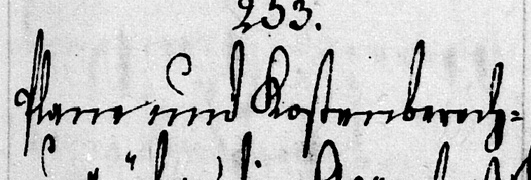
Plane und Kostenberec¬
